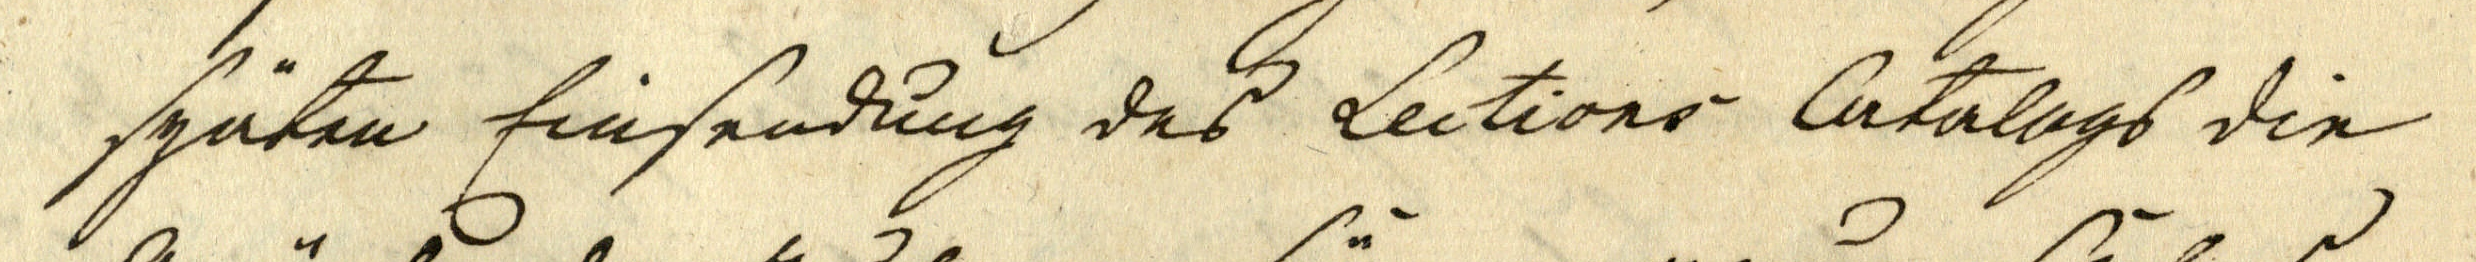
späten Einsendung des Lections Catalogs die
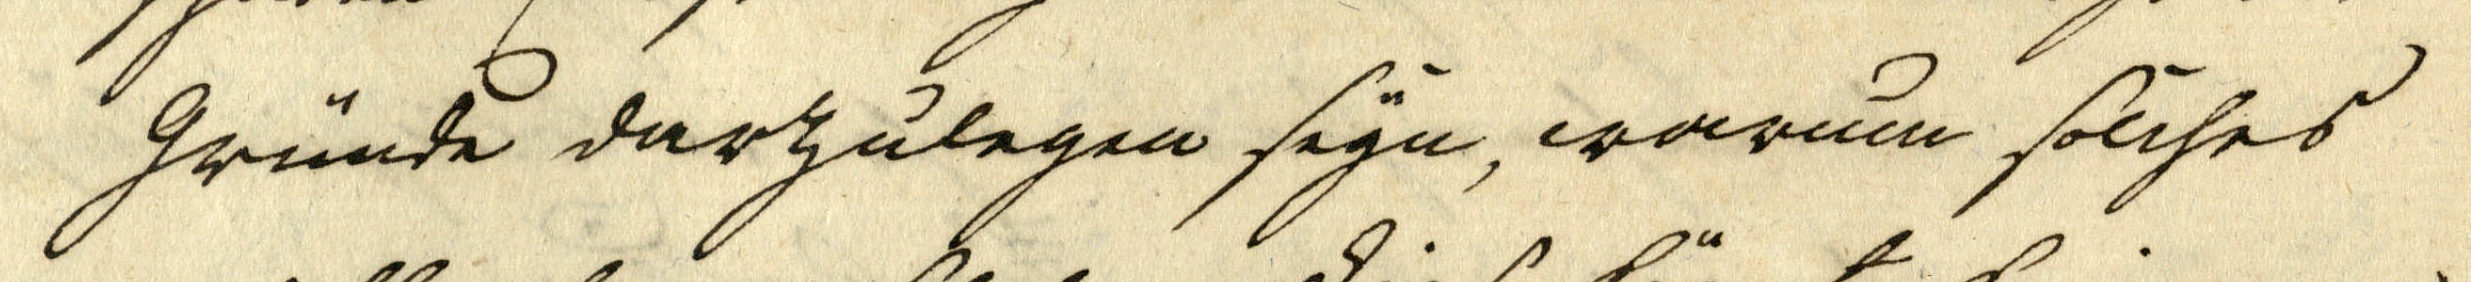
Gründe darzulegen seÿn, warum solches
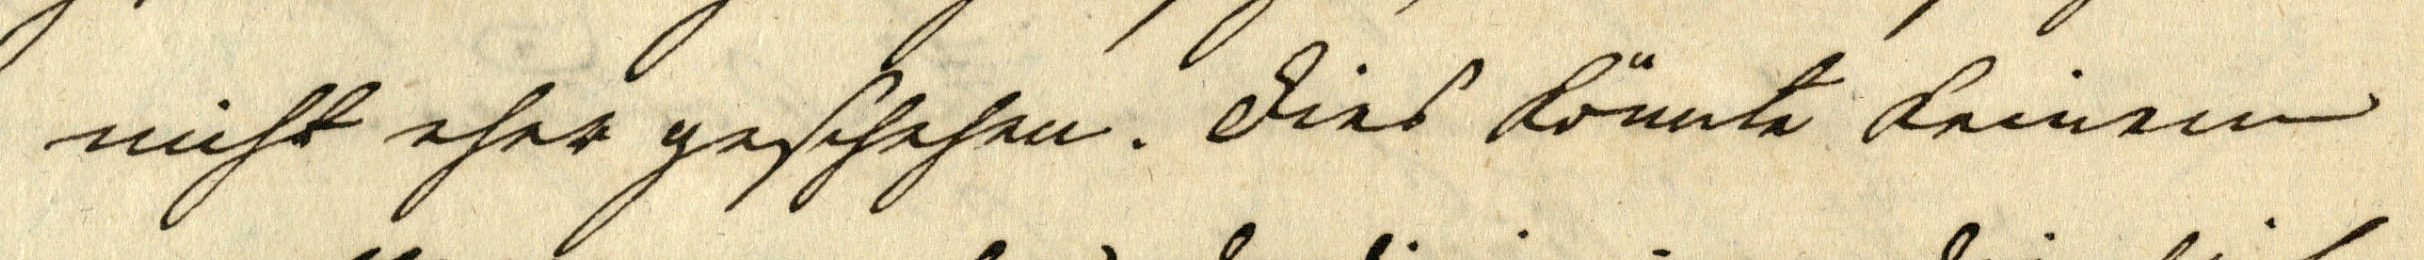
nicht eher geschehen. Dies könnte keinem
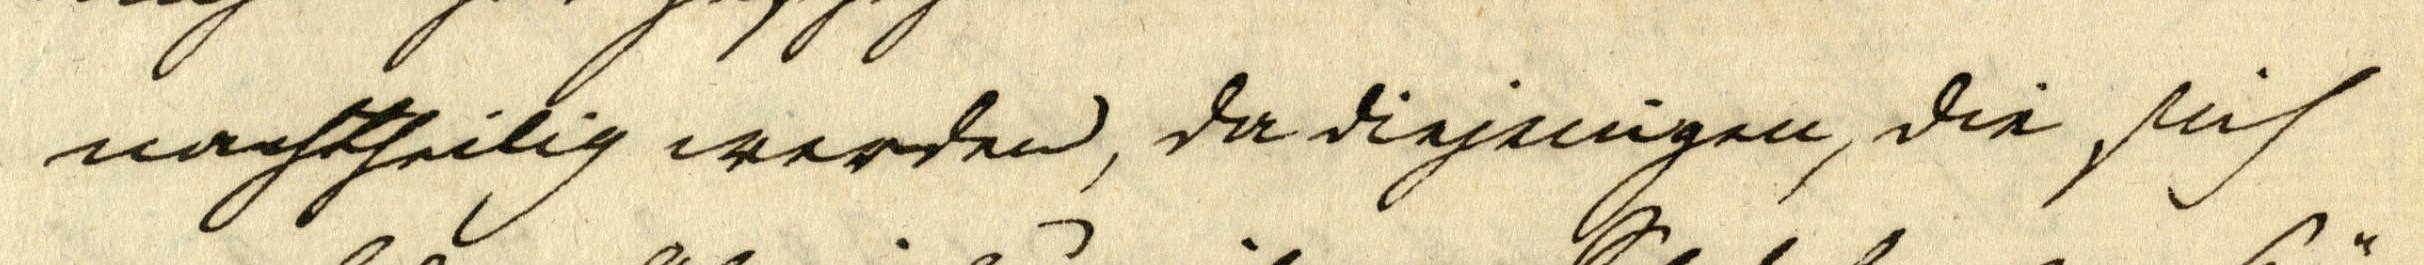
nachtheilig werden, da diejenigen, die sich
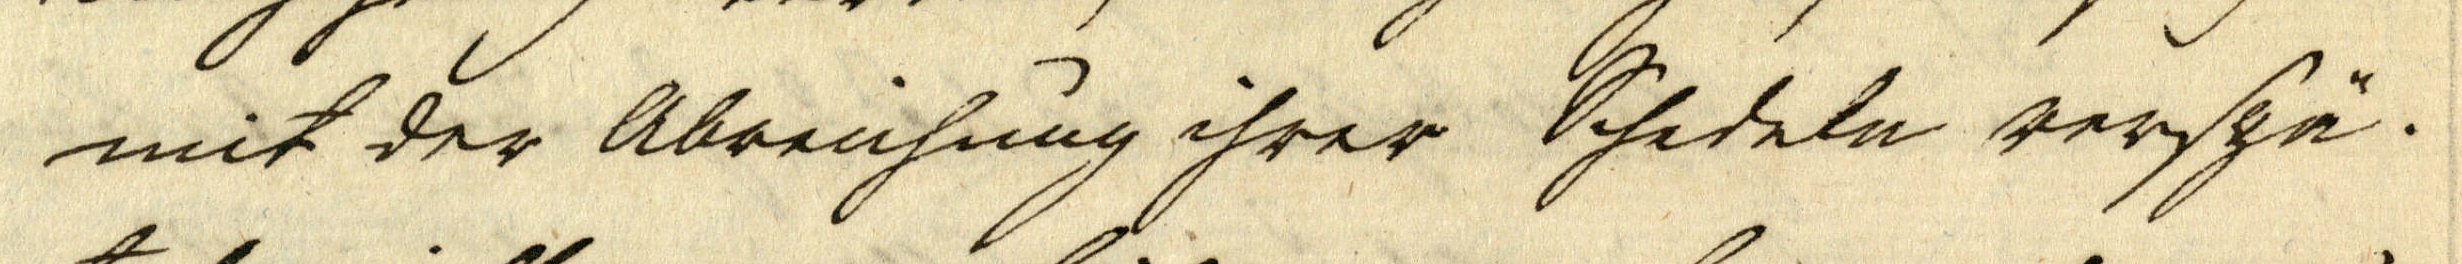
mit der Abreichung ihrer Schedeln verspä¬
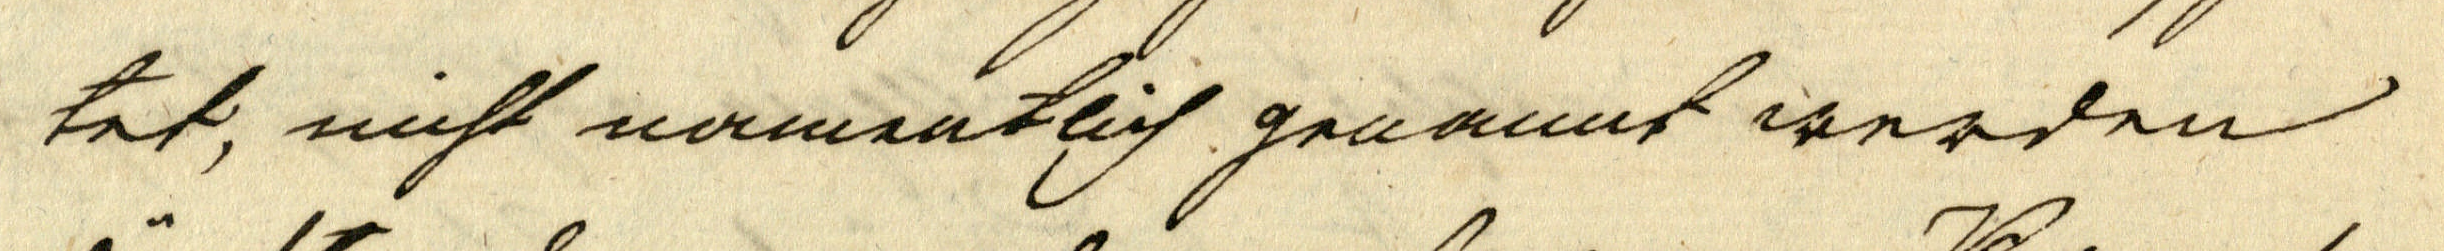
tet, nicht namentlich genannt werden
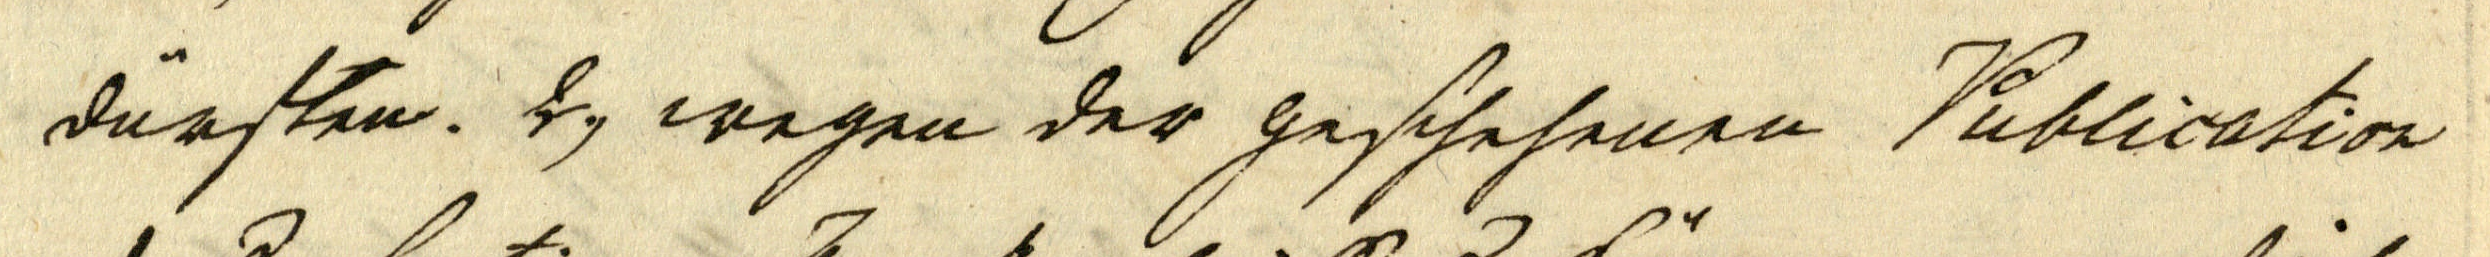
dürften. 2., wegen der geschehenen Publication
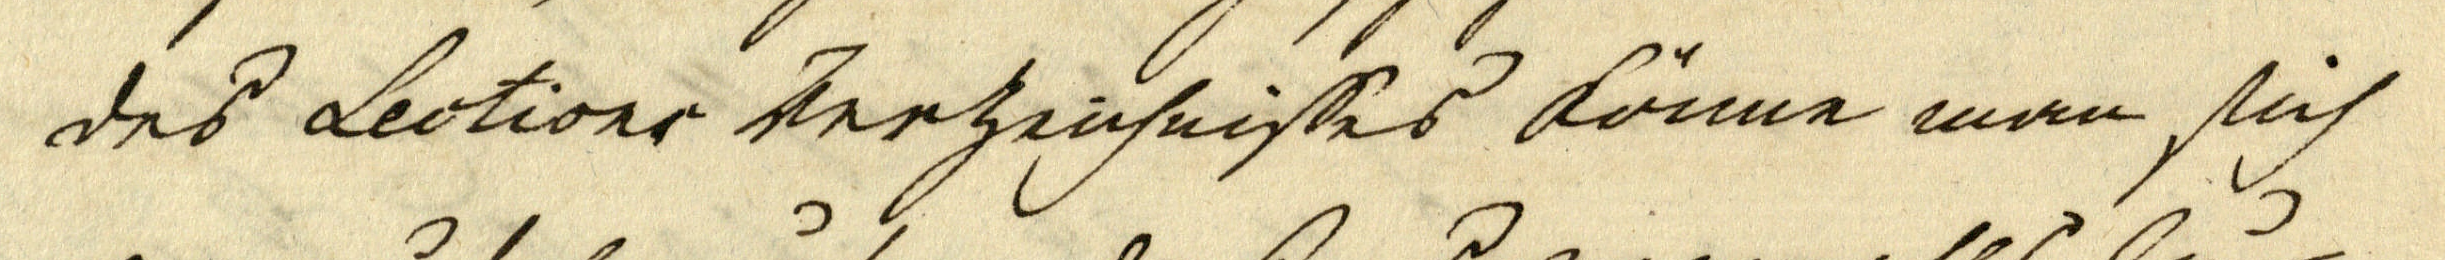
des Lections Verzeichnisses könne man sich
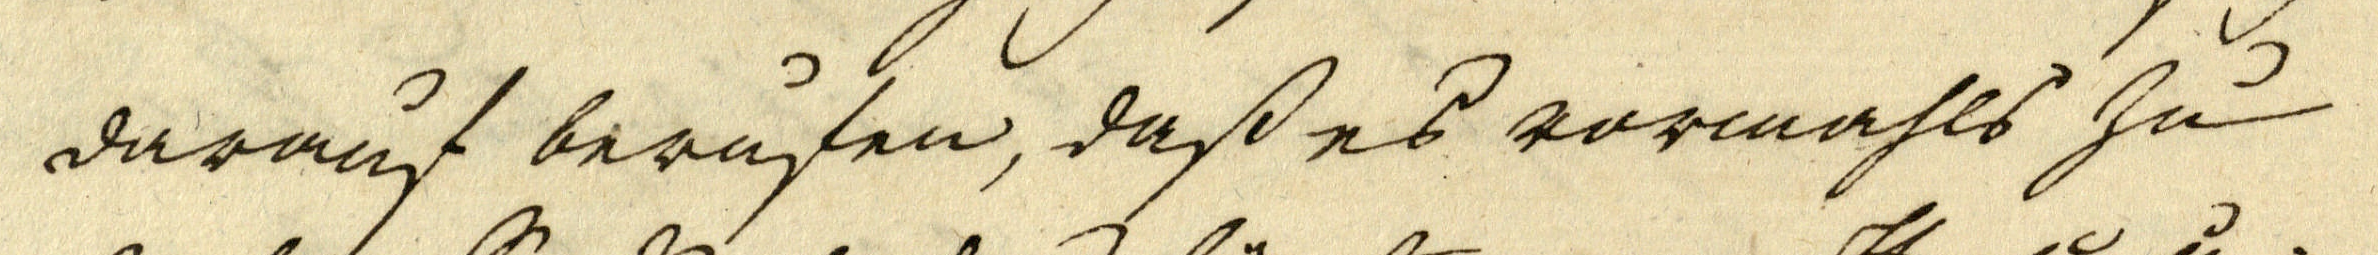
darauf berufen, daß es vormahls zu
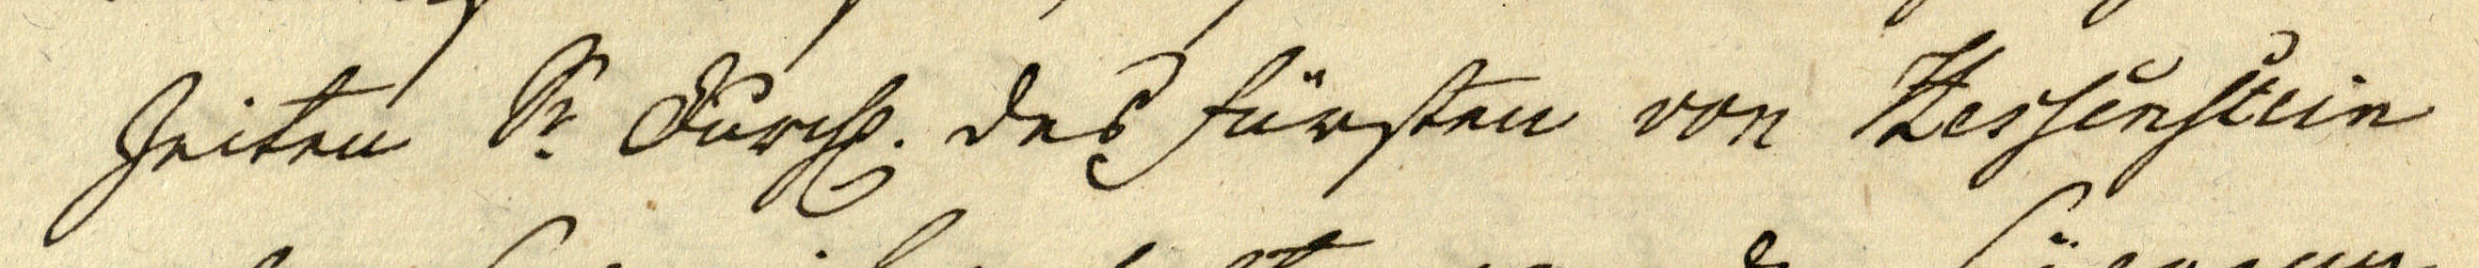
Zeiten Sr Durchl. des Fürsten von Hessenstein
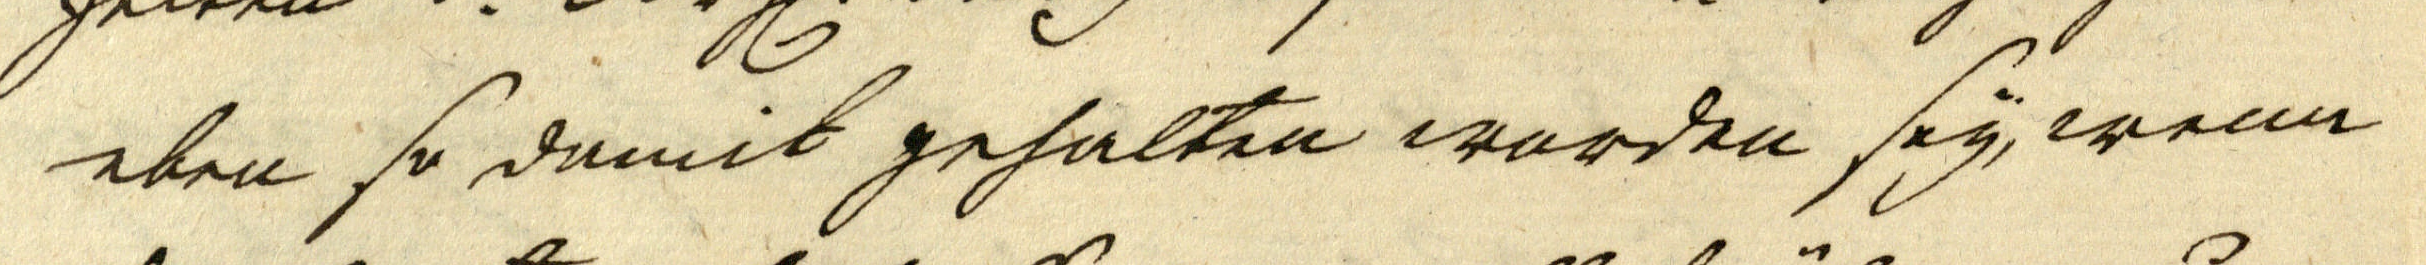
eben so damit gehalten worden seÿ, wenn
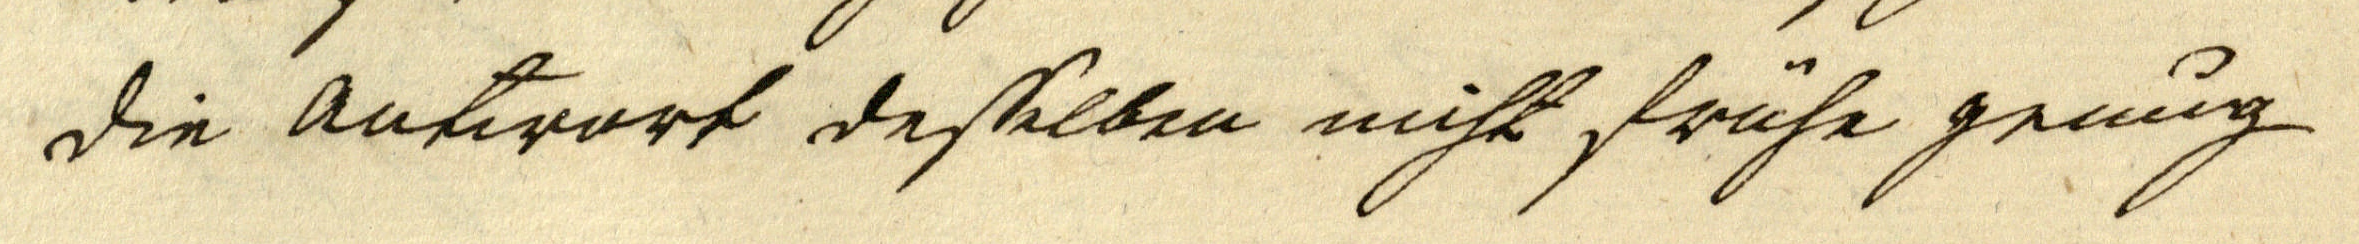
die Antwort desselben nicht frühe genug
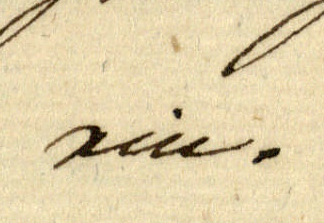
ein
